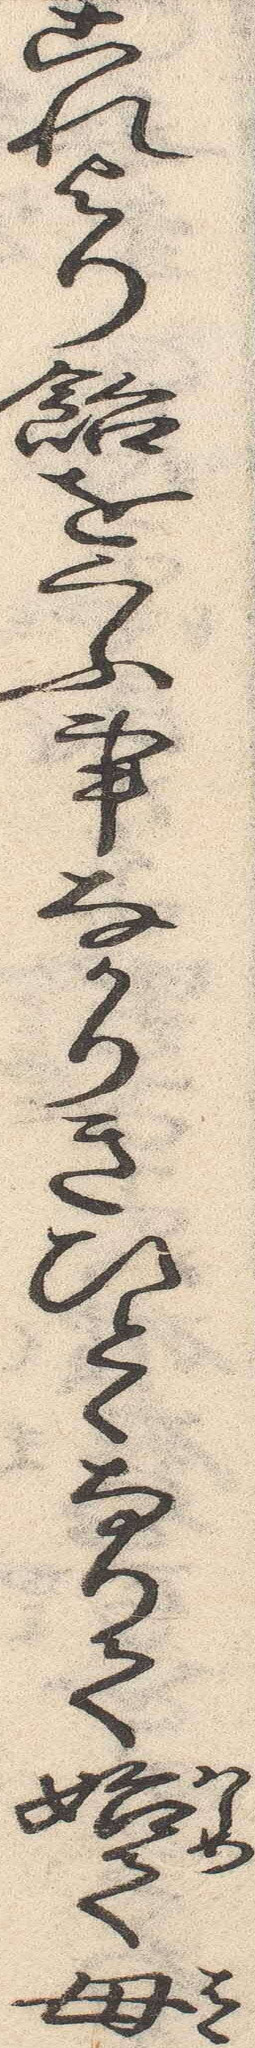これより飴をくふ事なかりきひとゝなりて始て母
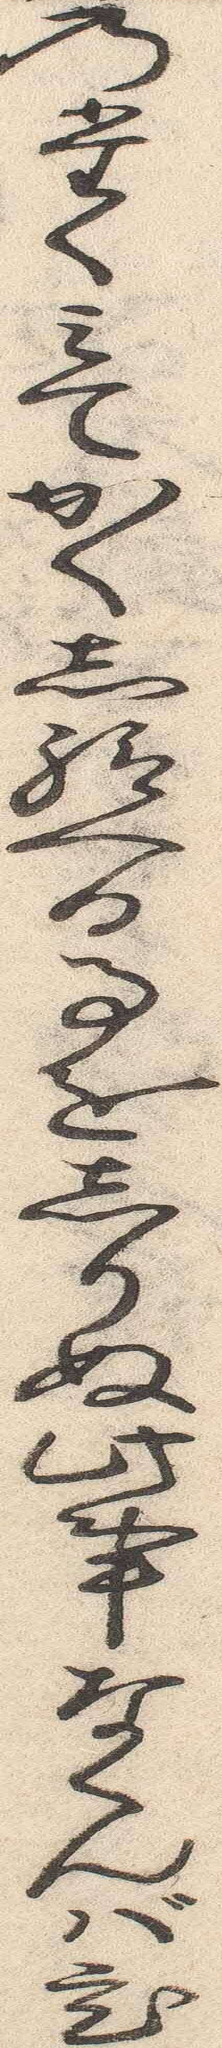のたくみてかくし給へる事をしりぬ此事なくんばひ
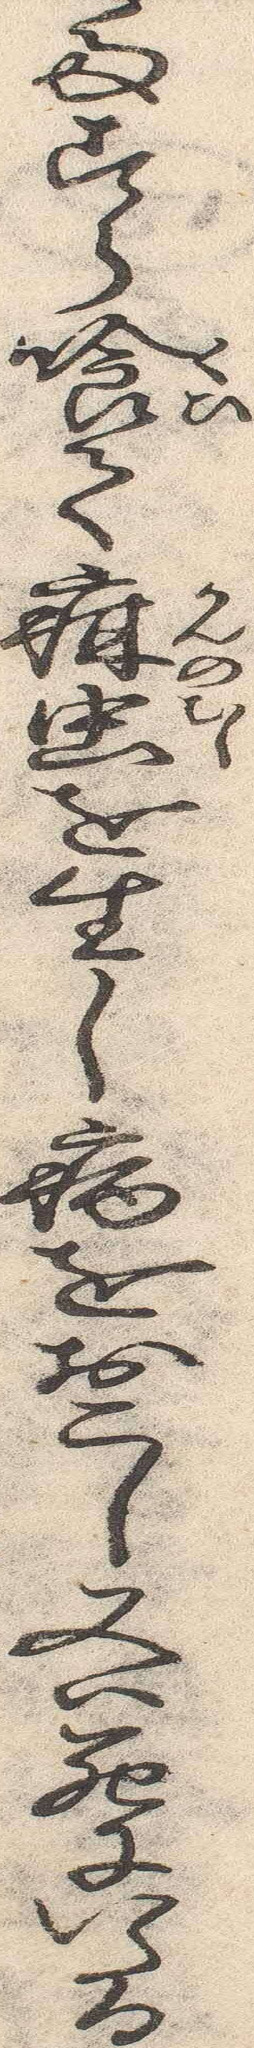たすら喰て疳虫を生し病をおこし又は死にいたる
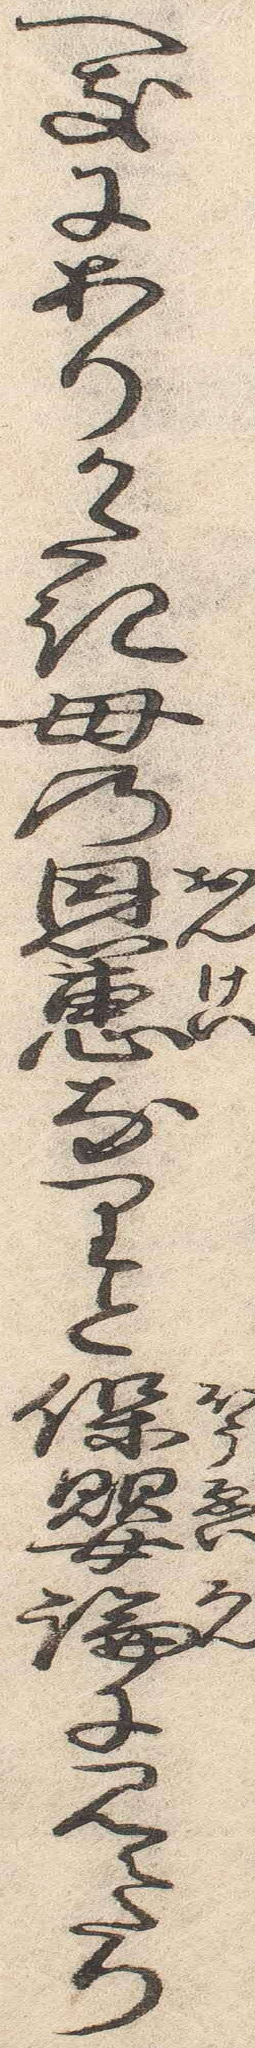へきにありかたき母の恩恵なりと保嬰論に見えたり
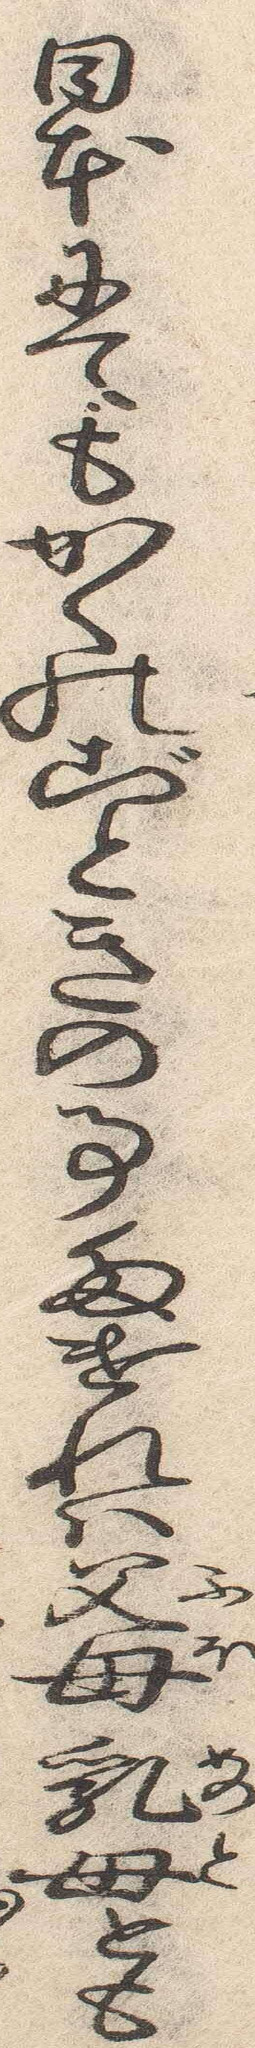日本にてもかくのごときの事多けれは父母乳母とも
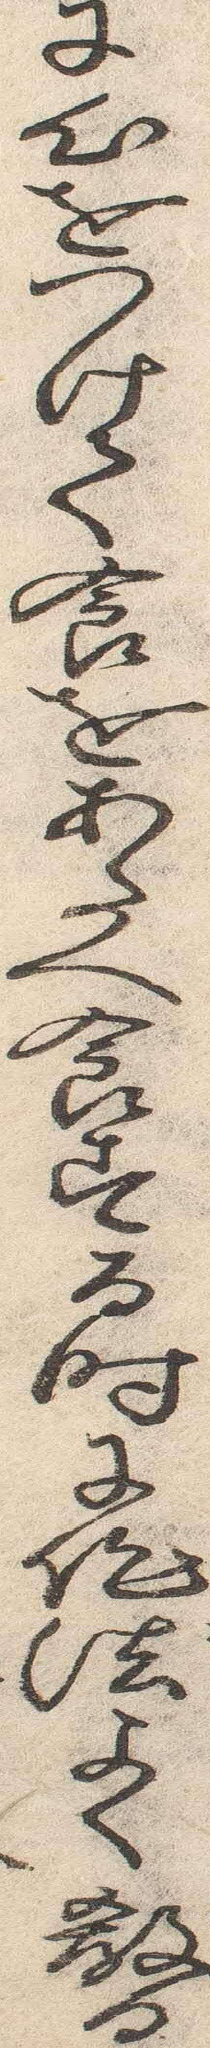に心をつけて食をあたへ食する時に作法よく教る
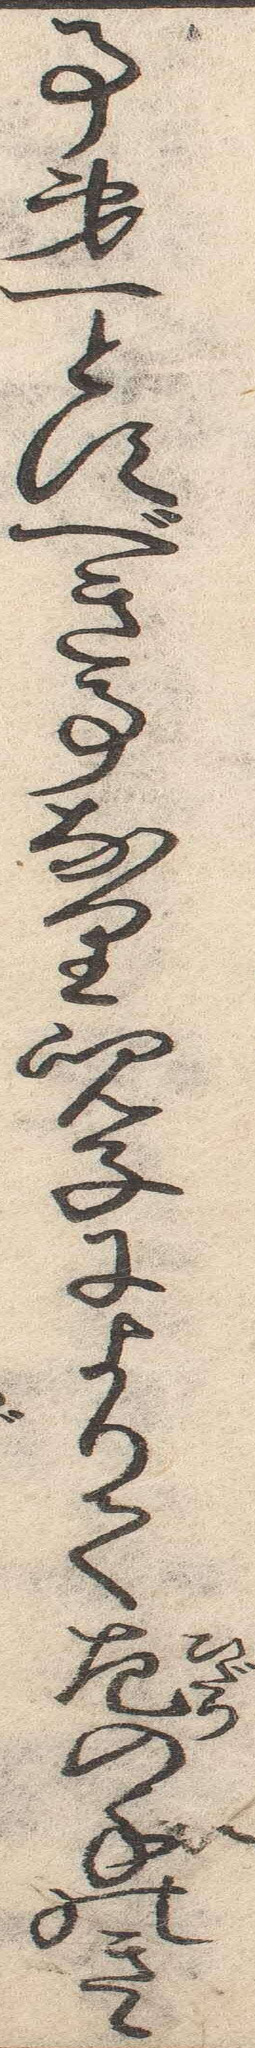事第一とすべき事なり児子によりて左の手のきゝ
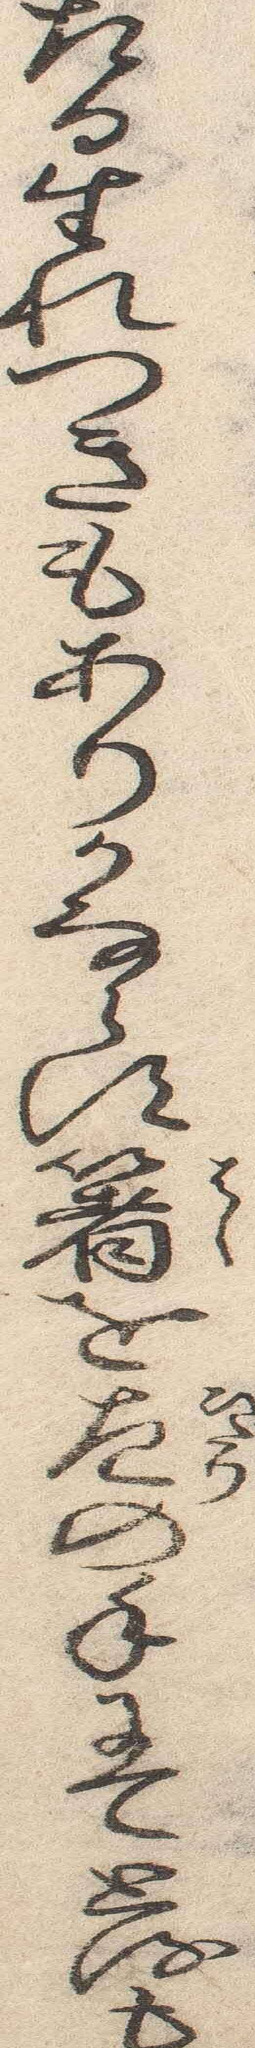たる生れつきもありかならす箸を左の手にてとるも
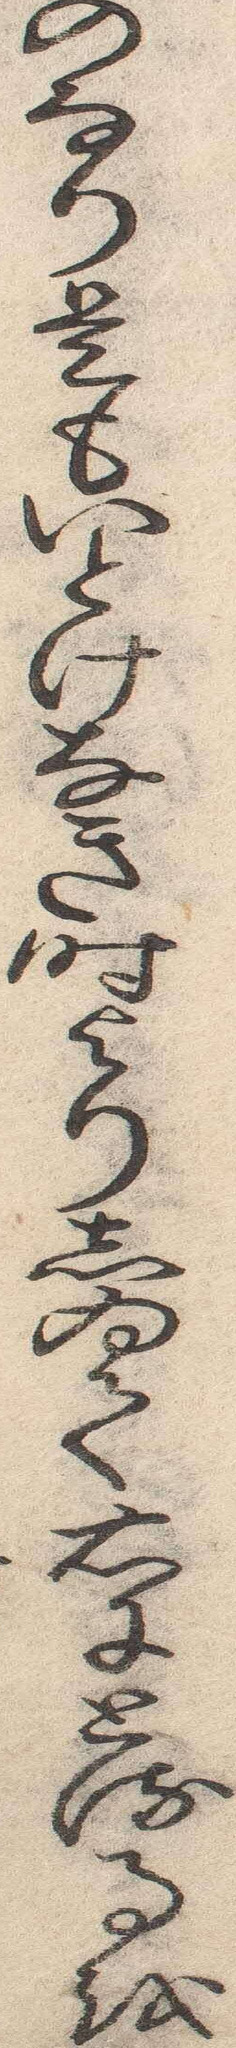のなり是もいとけなき時よりしゐて右にとる事を
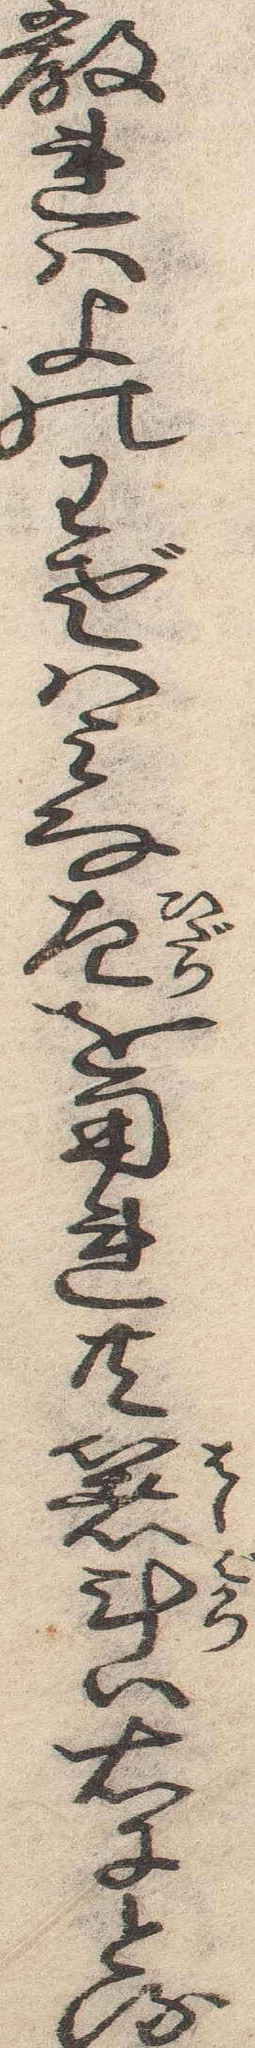教れはよのわざはみな左を用れ共箸計は右にとる
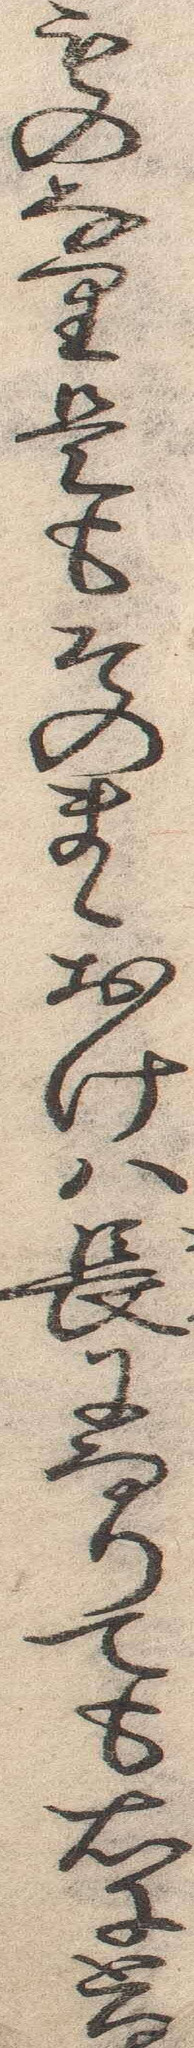ものなり是もそのまゝおけは長になりても右にとる

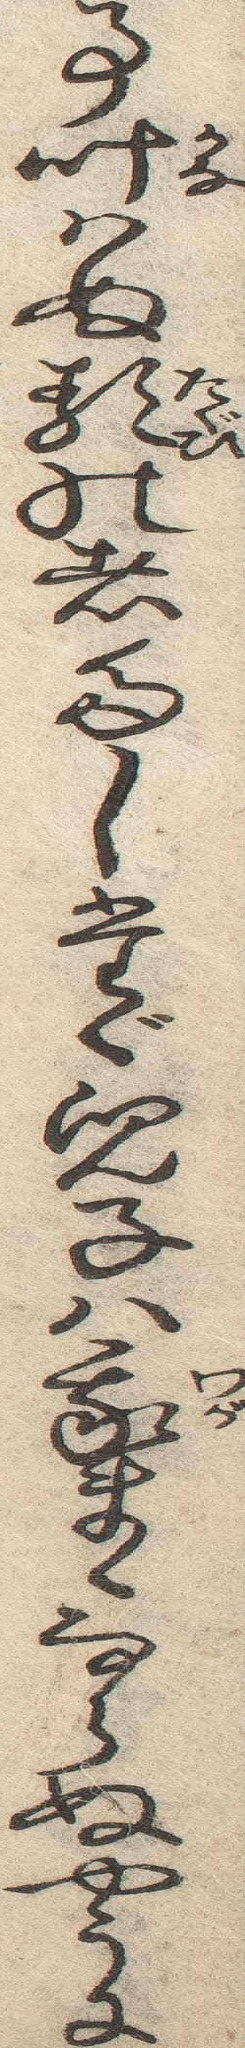事叶はぬ類の者多したゞ児子は我まゝならぬやうに
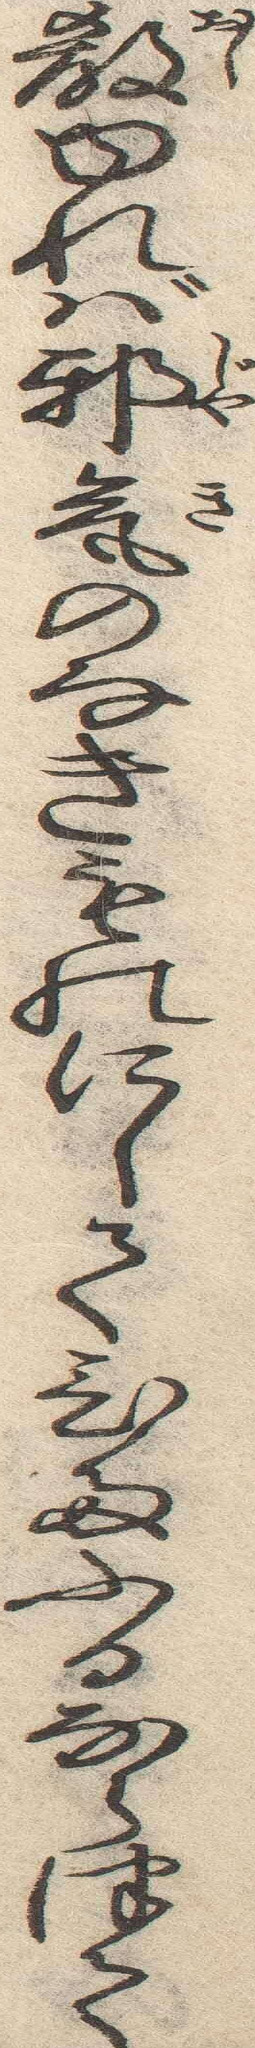教ゆれば邪気のなきものにしてひたふるならつて
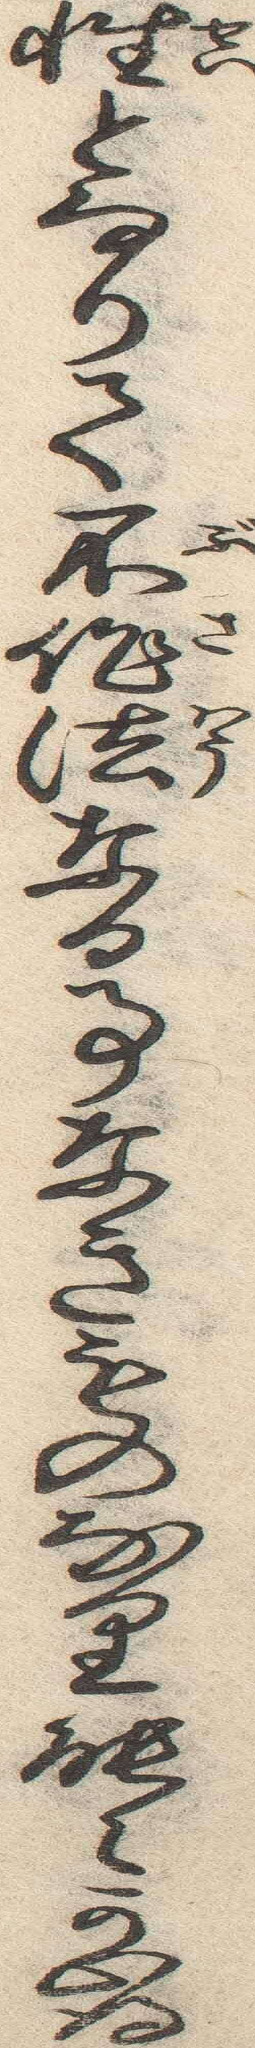性となりて不作法なる事なきものなり能々可心得
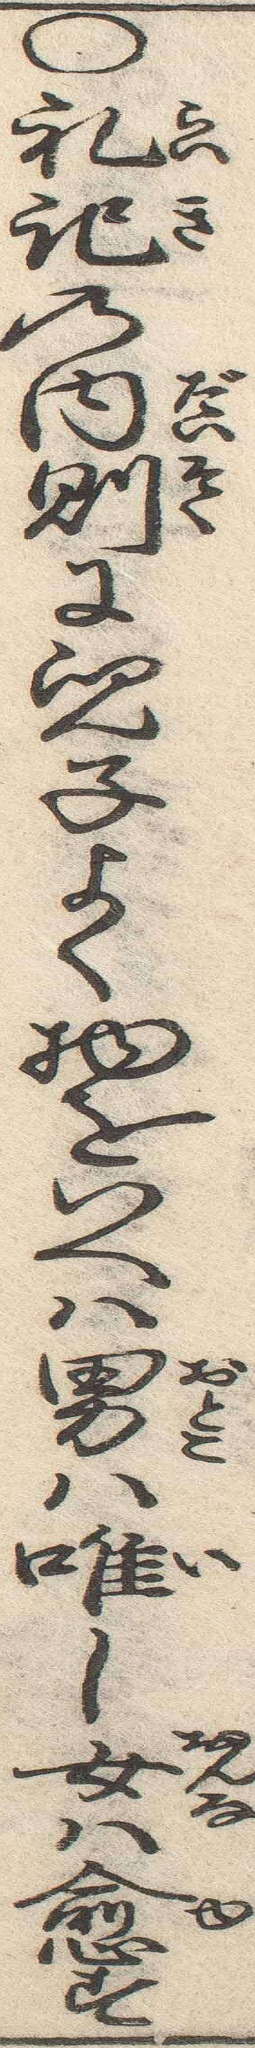○礼記の内則に児子よく物をいへは男は唯し女は愈す
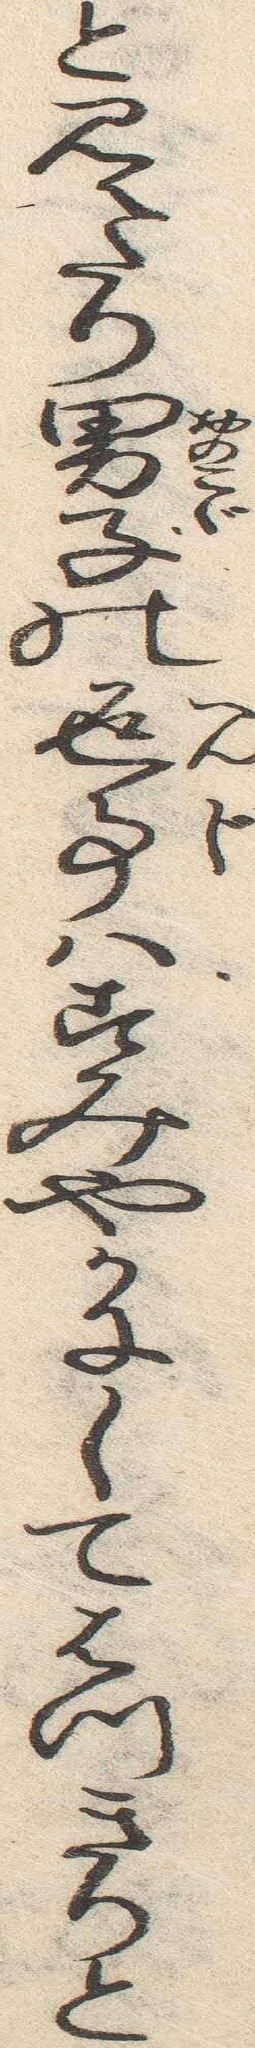と見えたり男子の返事はすみやかにしてはつきりと
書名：小児必用養育草
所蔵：東京学芸大学附属図書館 国文学研究資料館
